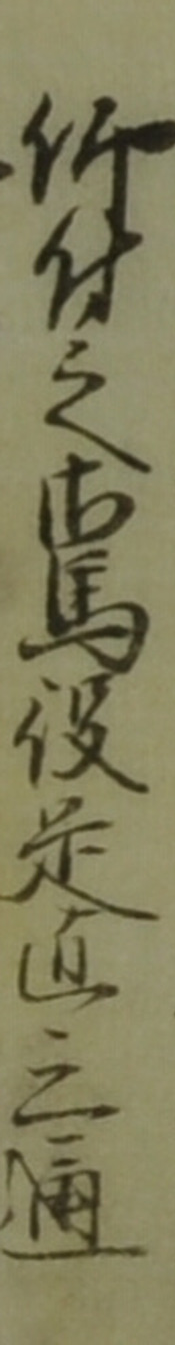仰付之御馬役是迄之通
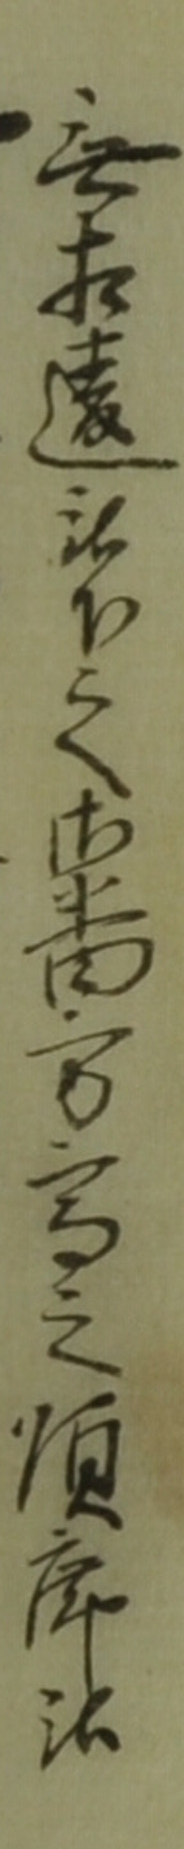無相違被下之御番方高之順席被
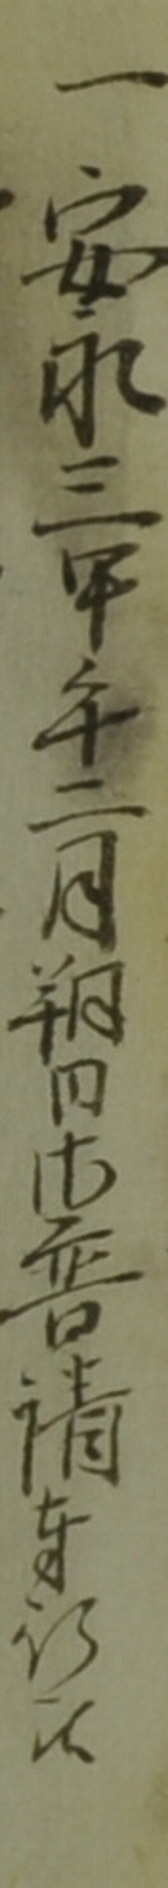一安永三甲午二月朔日御普請奉行被
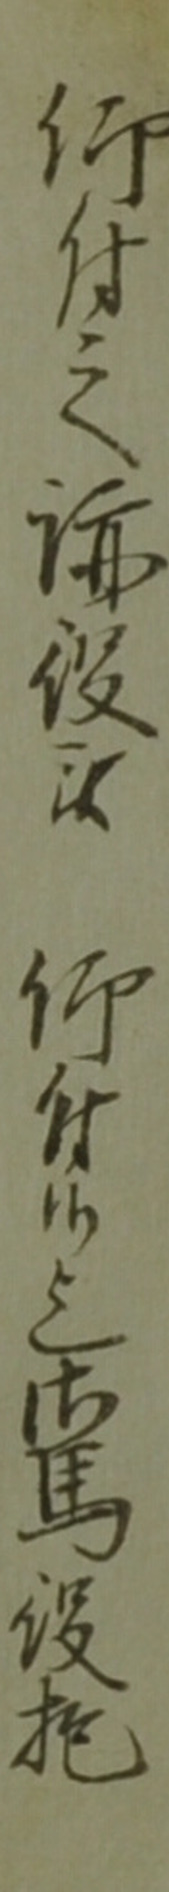仰付之跡役被仰付候迄御馬役抱
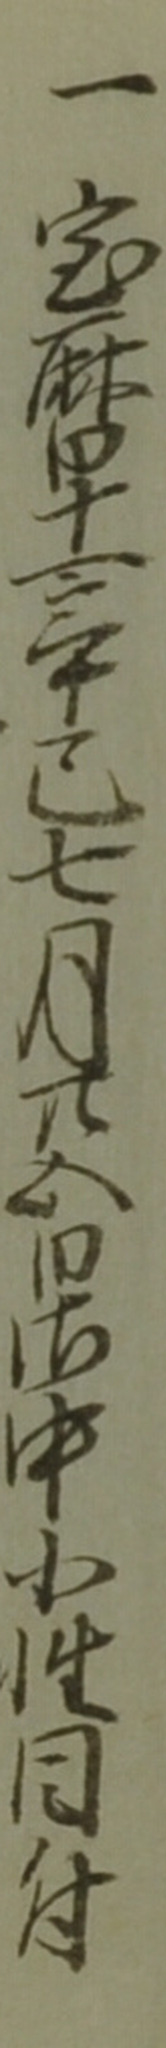一宝暦十一辛巳七月廿五日御中小性目付
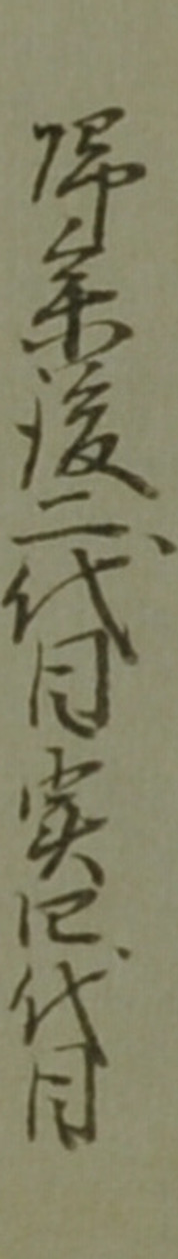帰参後二代目実四代目
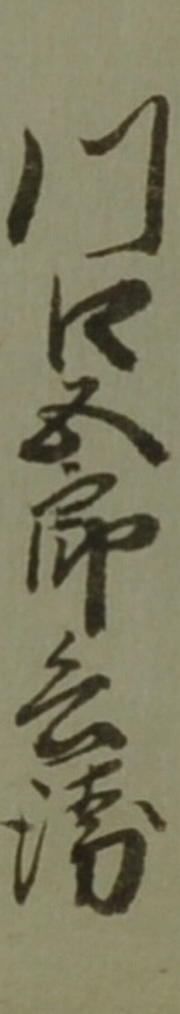川口五郎兵衛
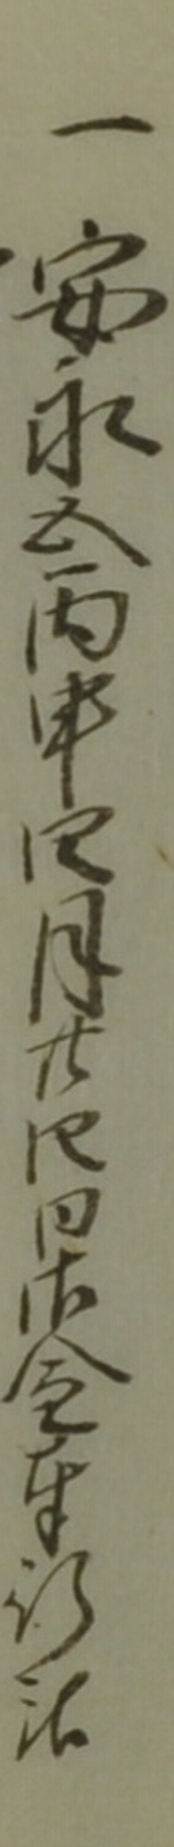一安永五丙申四月廿四日御金奉行被
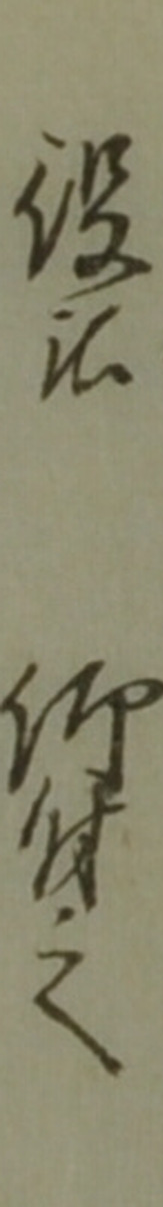役被仰付之
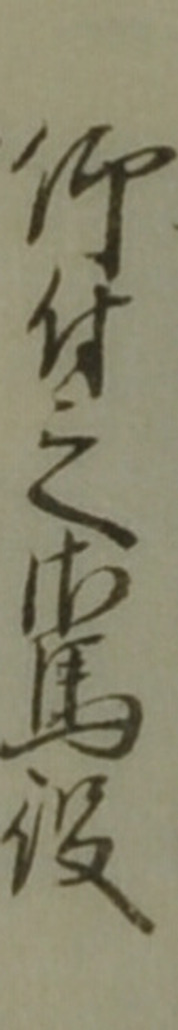仰付之御馬役
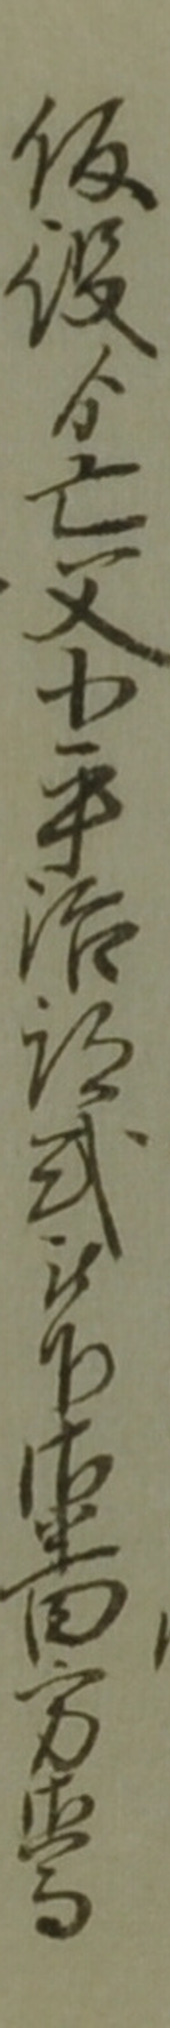仮役より亡父小平治跡式被下御番方御馬
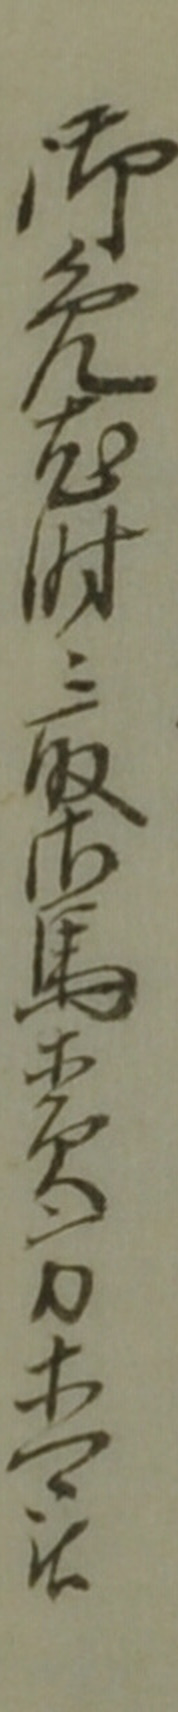御免尤時ニ取御馬責方等可被
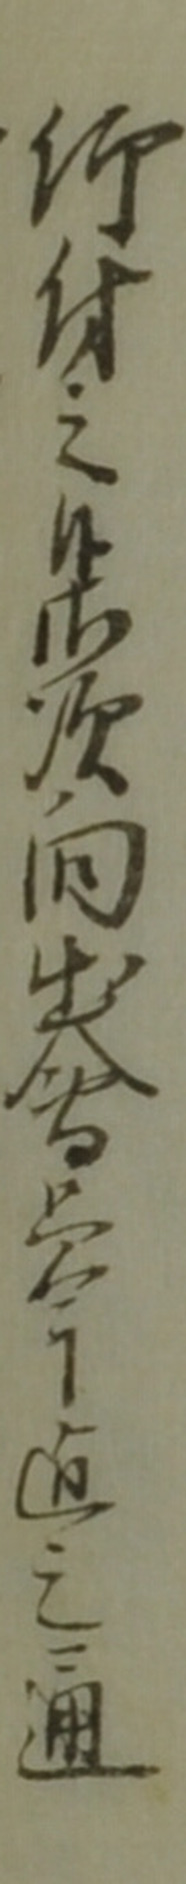仰付之候御次向出会只今迄之通
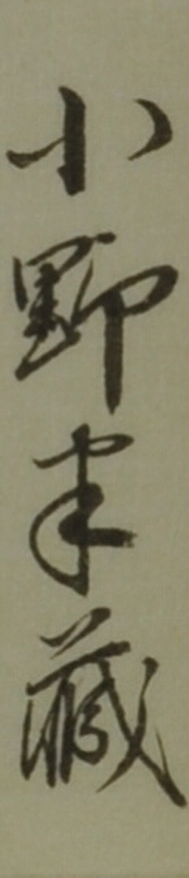小野半蔵
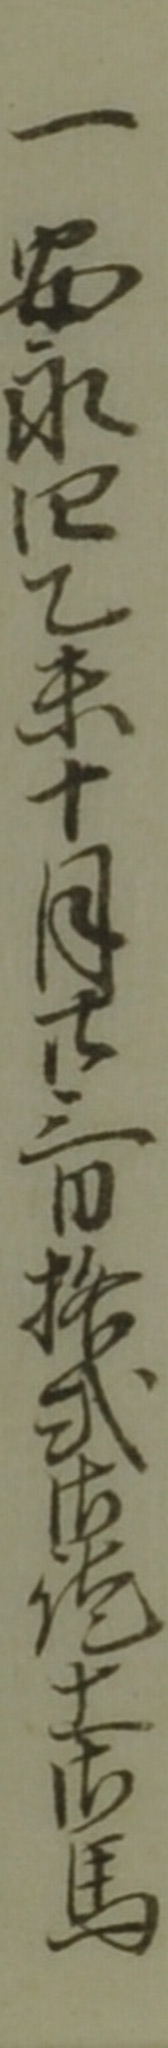一安永四乙未十月廿三日格式御徒士御馬
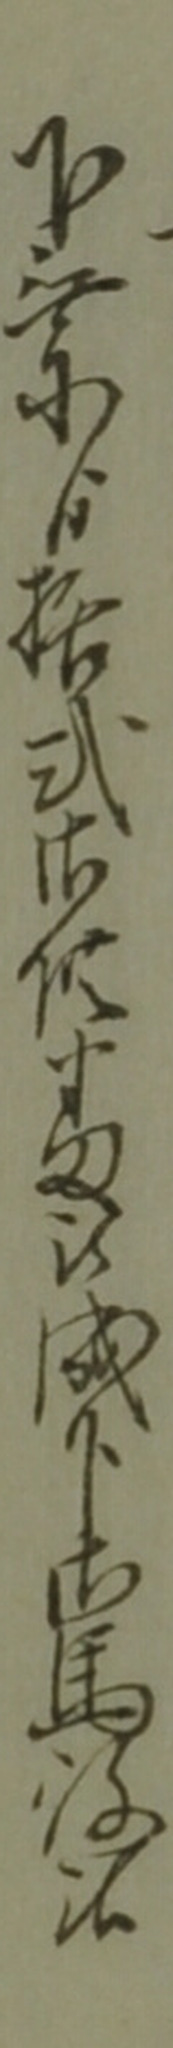下乗より格式御供番被成下御馬役被
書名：諸御役代々録（八）
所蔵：伊那市立高遠町図書館・合同会社AMANE
